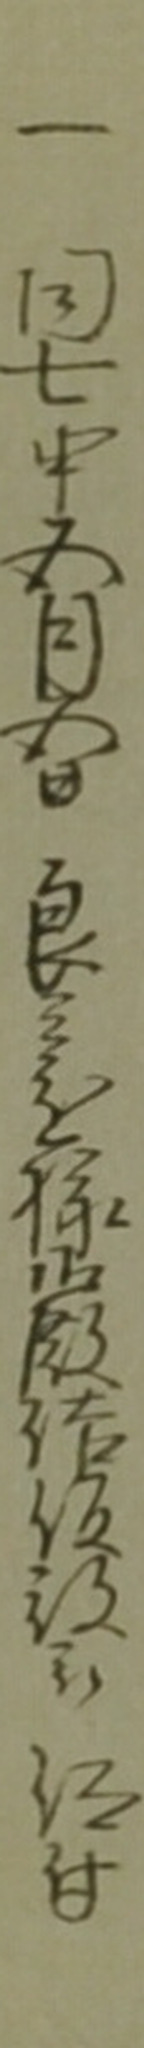一同七申五月五日良之進様御殿詰仮役被仰付
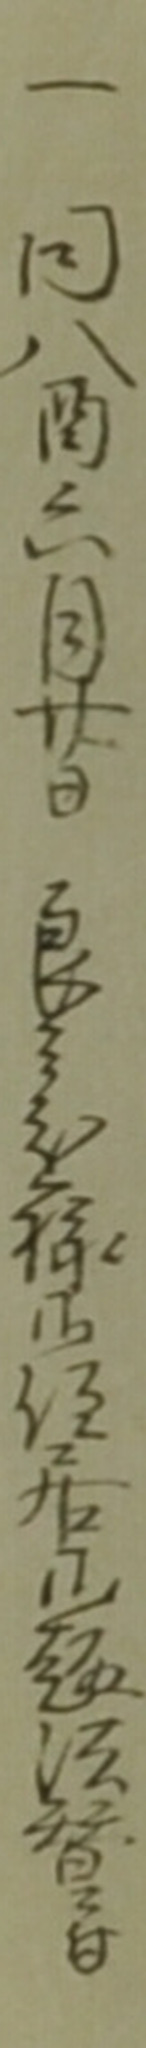一同八酉六月廿日良之進様御住居御趣法替ニ付
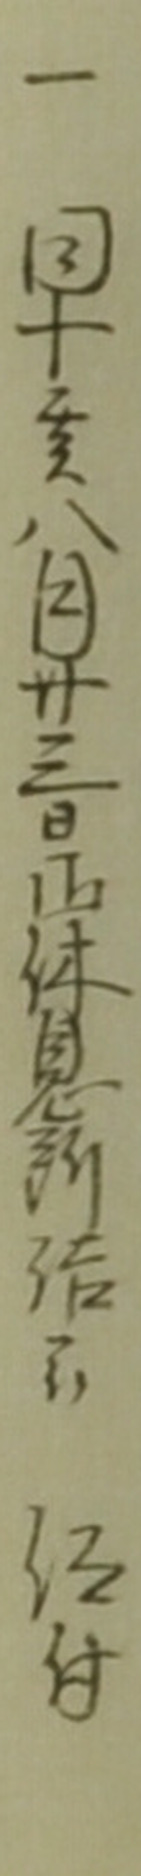一同十亥八月廿三日御休息所詰被仰付
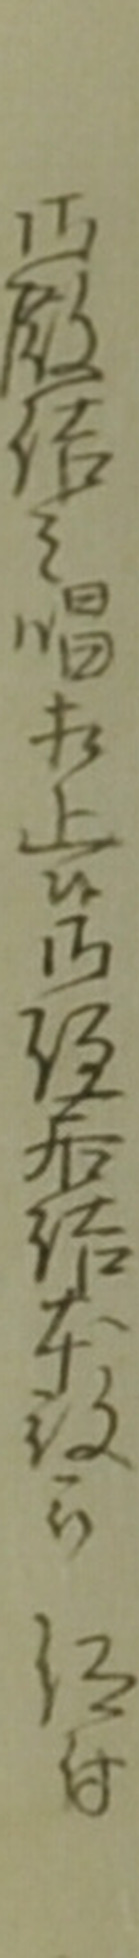御殿詰之唱相止候御住居詰本役被仰付

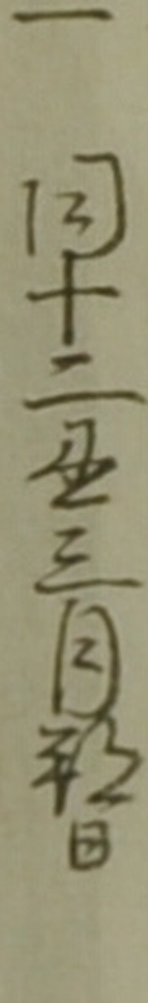一同十二丑三月朔日
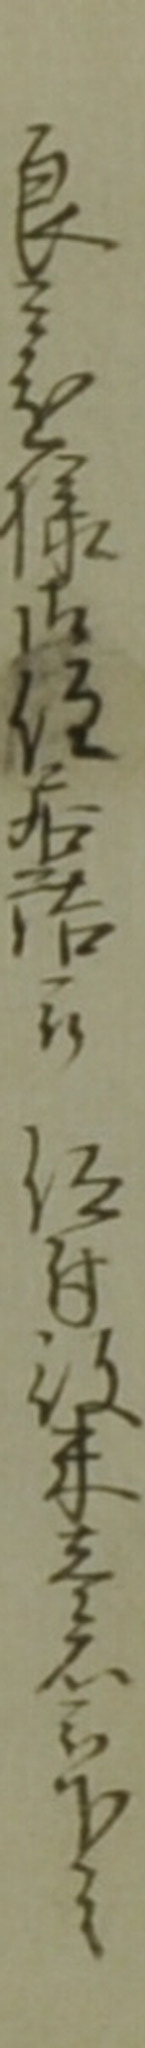良之進様御住居詰被仰付役来壱石被下之
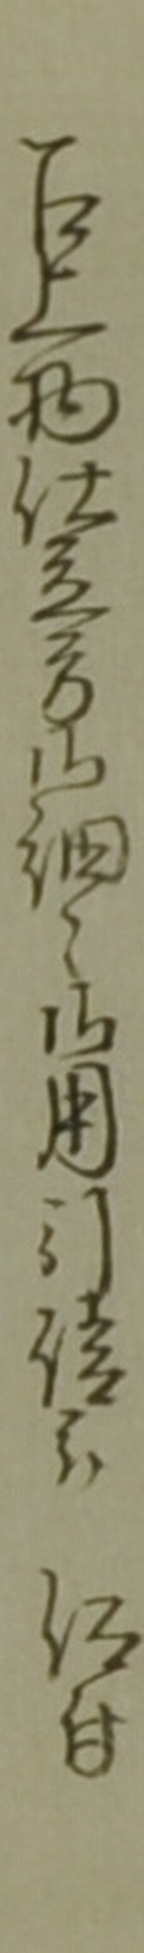召上物仕立方御細々御用引請被仰付
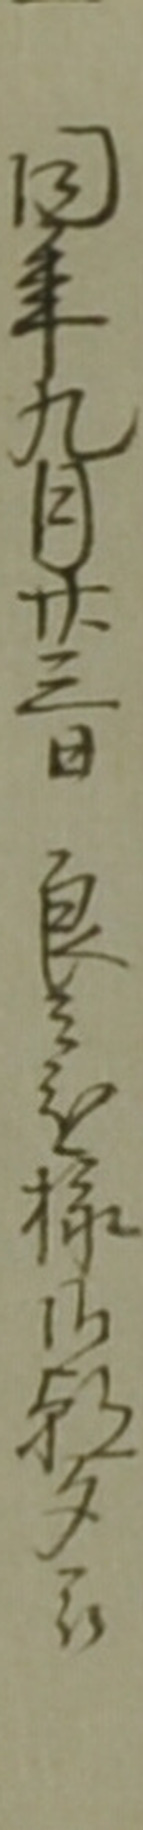一同年九月廿三日良之進様御朝夕被
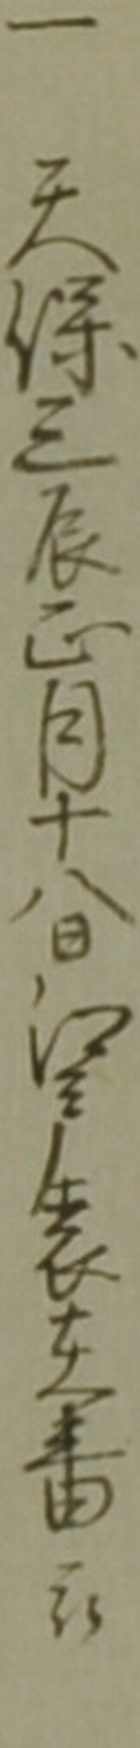一天保三辰正月十八日江戸表在番被
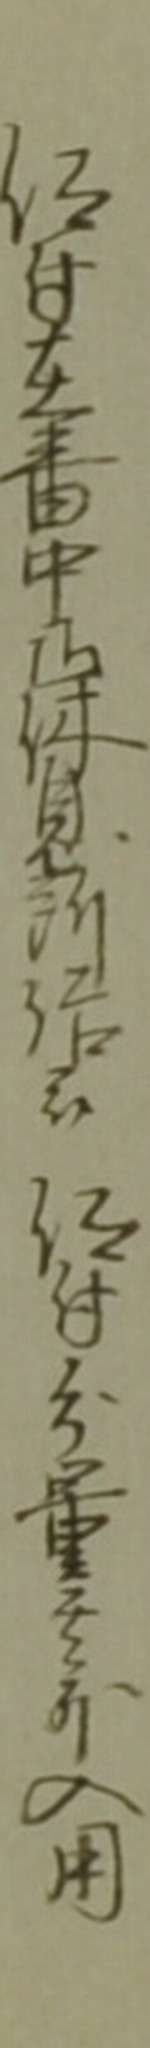仰付在番中御休息所詰被仰付分量其外入用
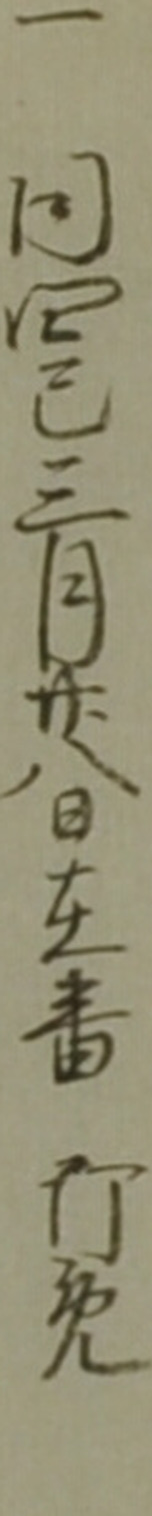一同四巳三月廿八日在番御免
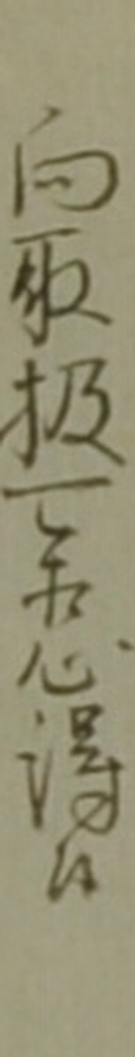向取扱可相心得候
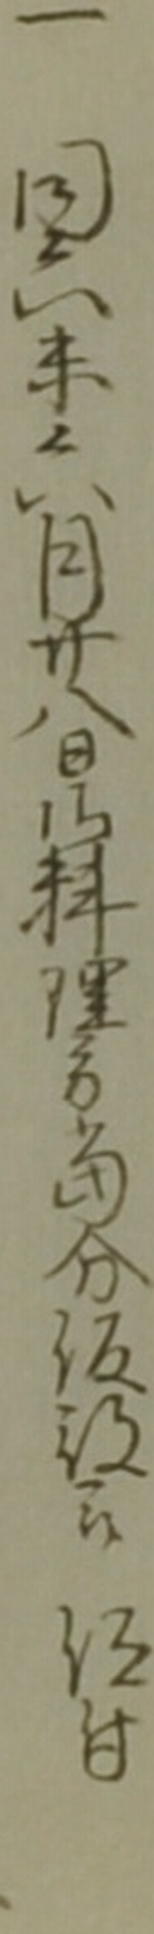一同六未六月廿八日御料理方当分仮役被仰付
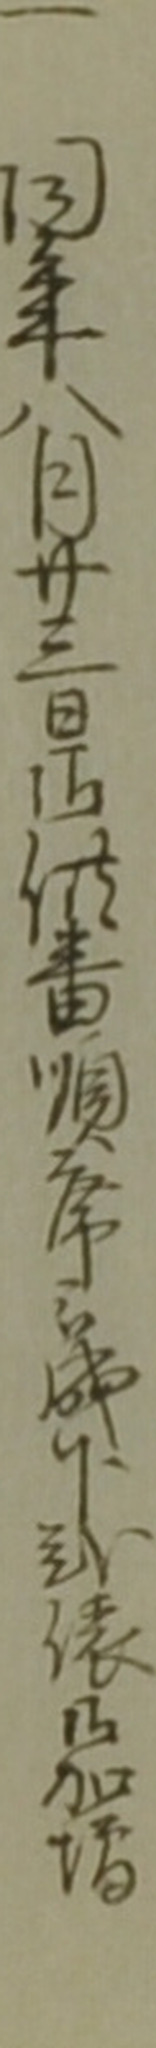一同年八月廿三日御供番順席被成下弐俵御加増
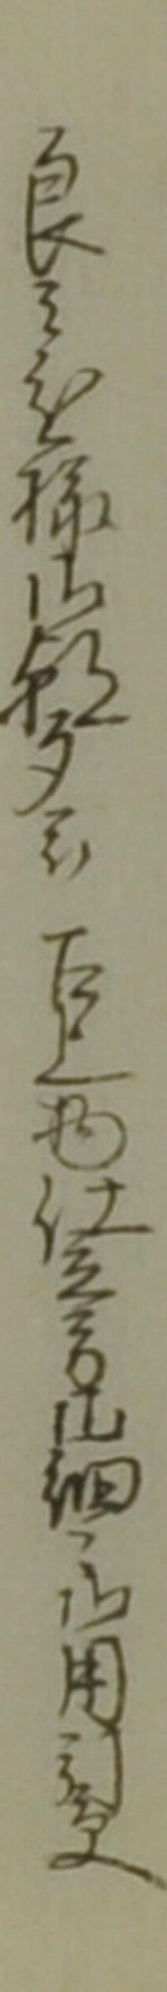良之進様御朝夕被召上物仕立方御細々御用引受
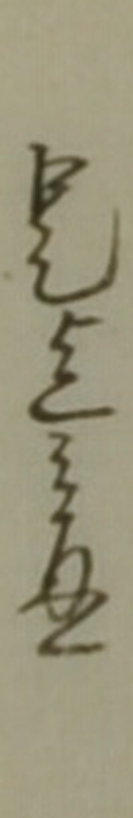是迄之通
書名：無足諸士勤仕録（五）
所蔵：伊那市立高遠町図書館・合同会社AMANE
